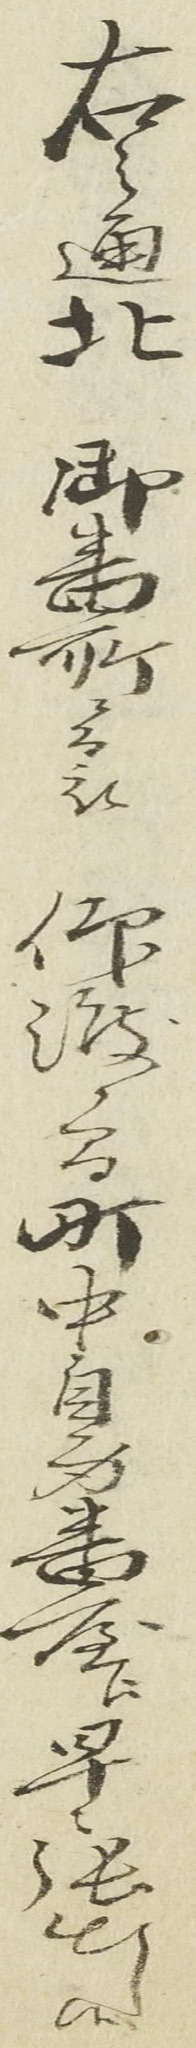右之通北御番所ニ而被仰渡候間町中自身番屋え早々張出し候
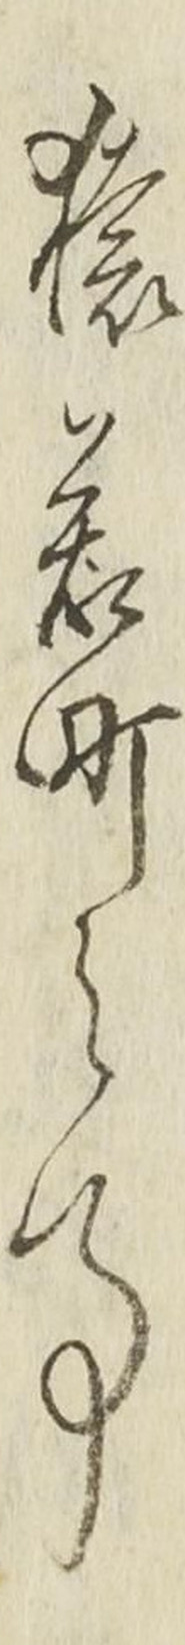猿若町之事
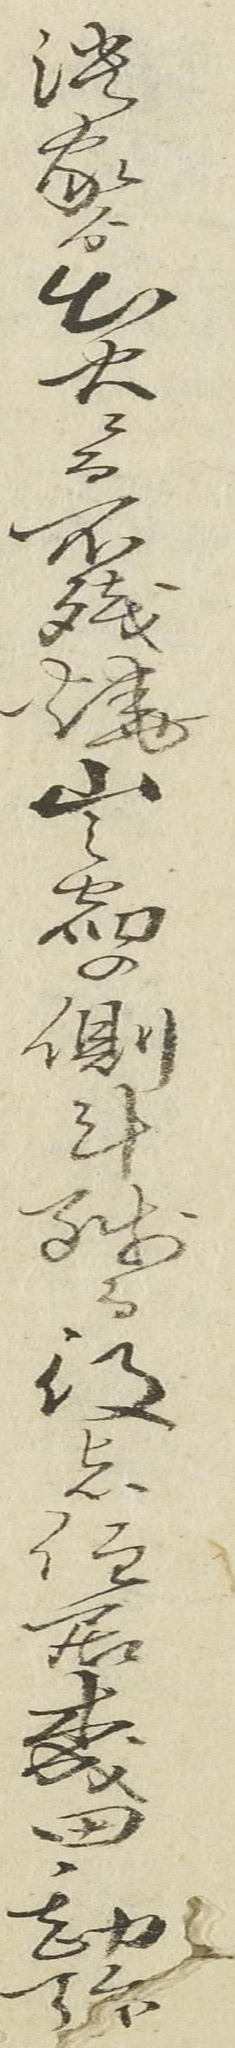潰家ゟ出火ニ而不残焼山之宿の側斗残る役は住居森田勘弥
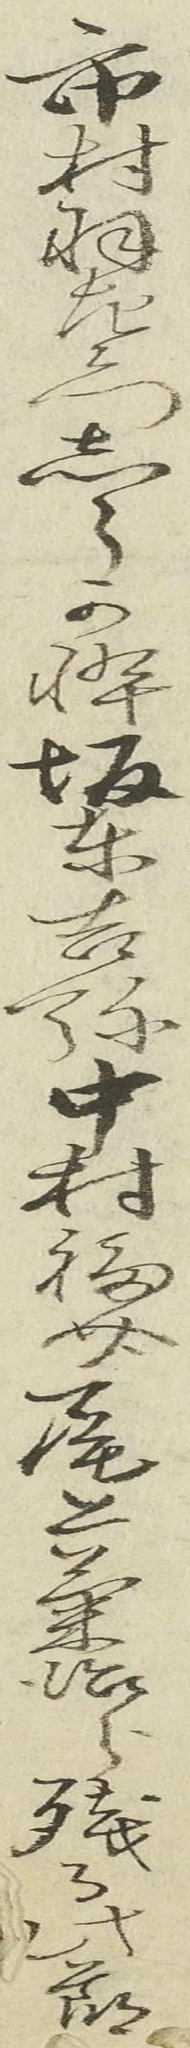市村羽左衛門志のか倅坂東吉弥中村福介尾上兼治郎残る此節
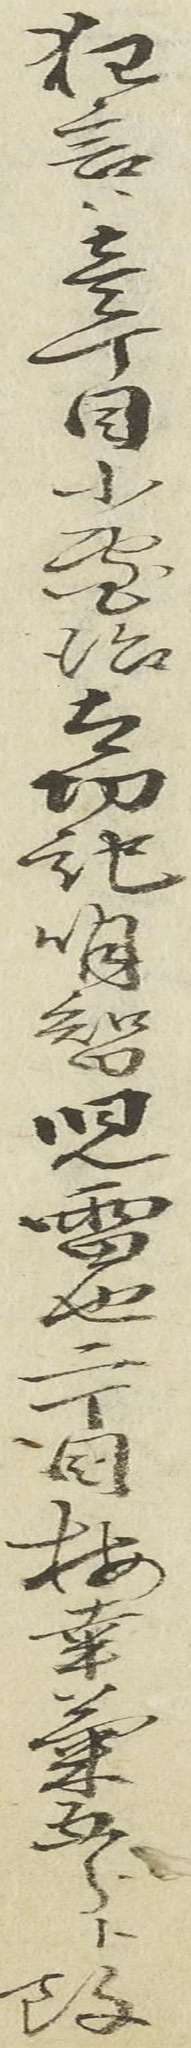狂言ハ壱丁目小円治大切記明智児雷也二丁目梅幸兼五郎ト改
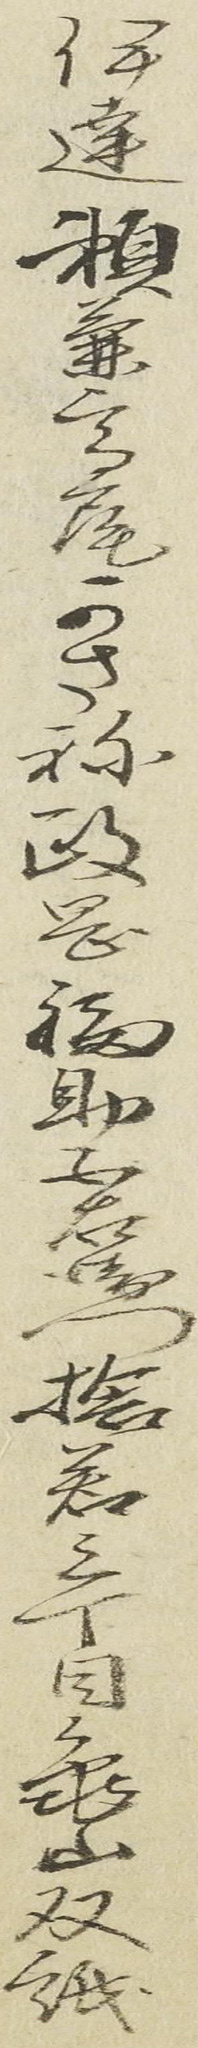伊達頼兼高尾かさね政岡福助五右衛門捨若三丁目亀山双紙
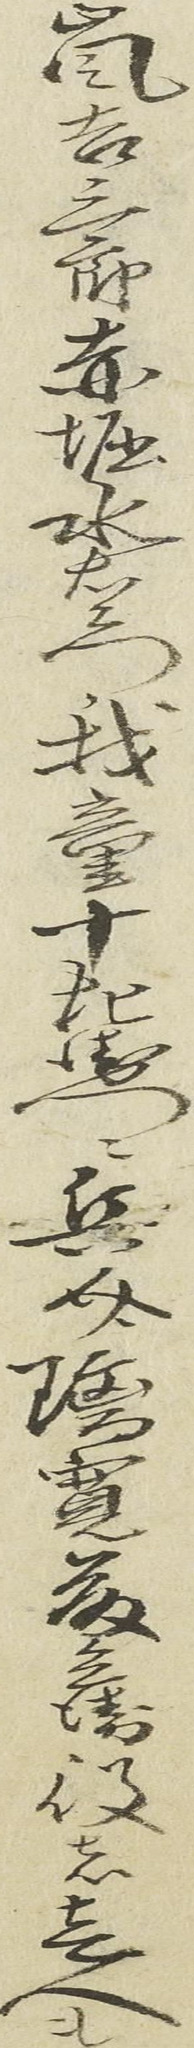嵐吉三郎赤堀水右衛門我童十左衛門ニ兵介璃寛藤兵衛役者壱人も
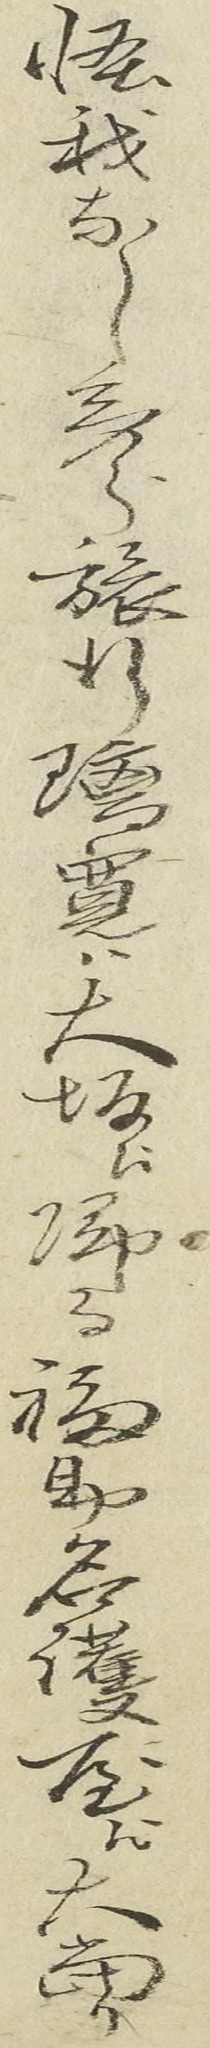怪我なし多分旅行璃寛ハ大坂え帰る福助名護屋え大当り

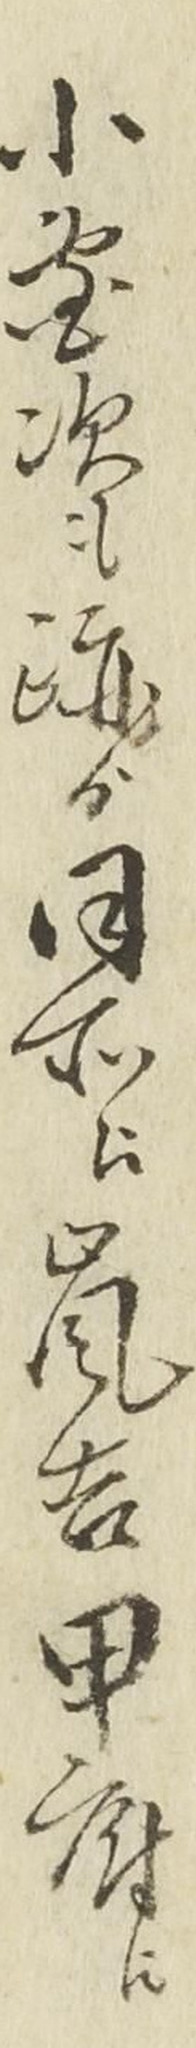小円次も跡より同所エ嵐吉甲府え
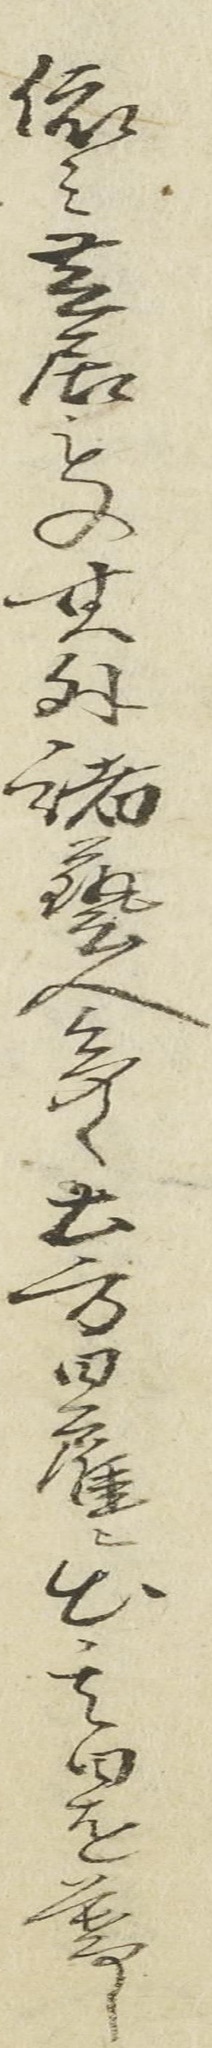依之芝居もの其外諸芸人多く土方日雇ニ出其日を暮し
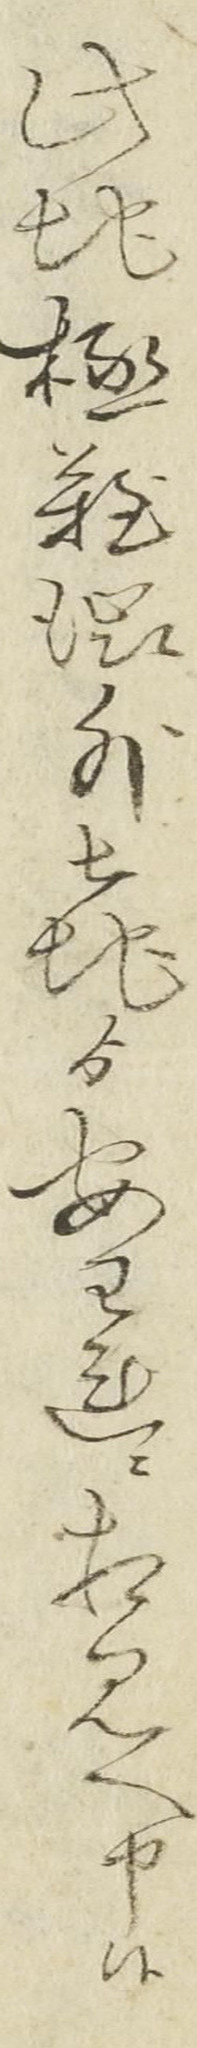此地極難渋外土地ゟあわれ二相見へ申候
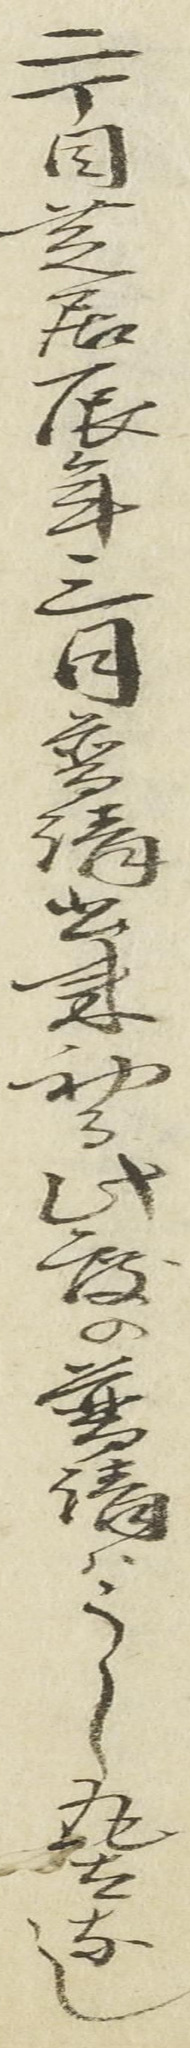二丁目芝居辰年三月普請出来初而此度の普請ハうし丸太なし
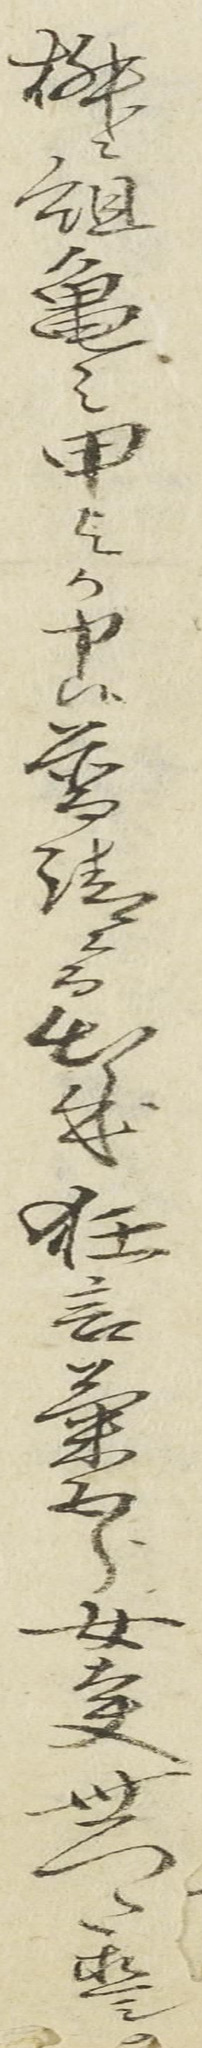桝ニ組亀之甲とか申候普請ニ而出来狂言菊五郎女太夫せつこ直し
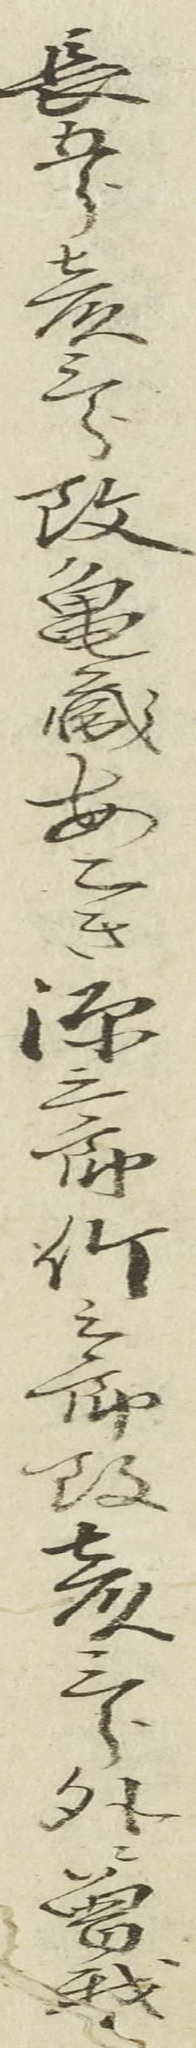長五郎彦三郎改亀蔵あこき源三郎竹三郎改彦三郎外二曽我
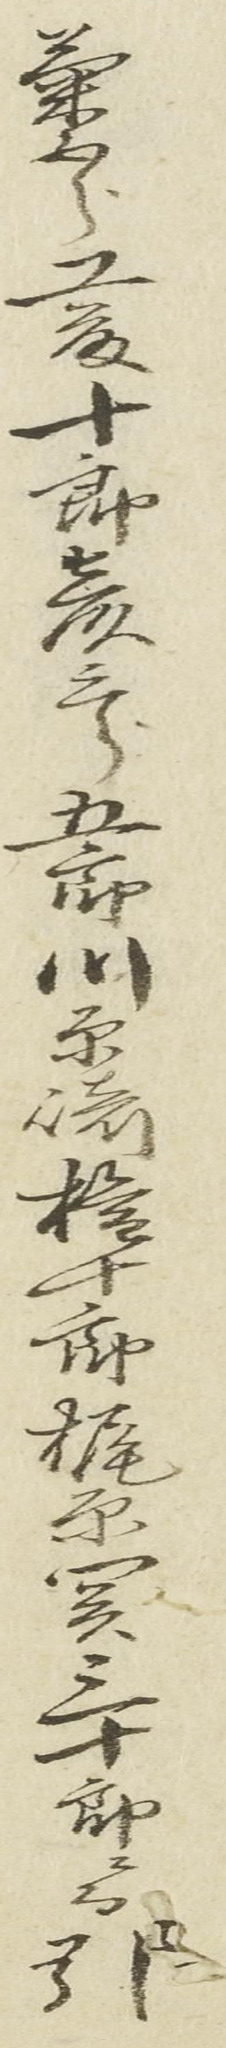菊五郎工藤十郎彦三郎五郎川原崎権十郎梶原関三十郎ニ而引
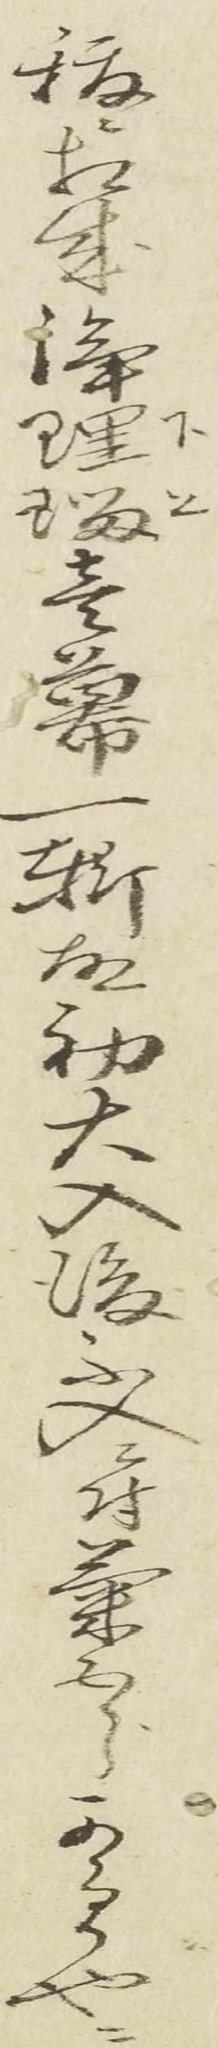抜ニ相成浄理瑠壱幕一軒故初大入後不入ニ付菊五郎かるかやニ
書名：安政二乙卯年十月二日大地震之事
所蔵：東京大学地震研究所図書室 Earthquake Research Institute Library, The University of Tokyo, JAPAN
